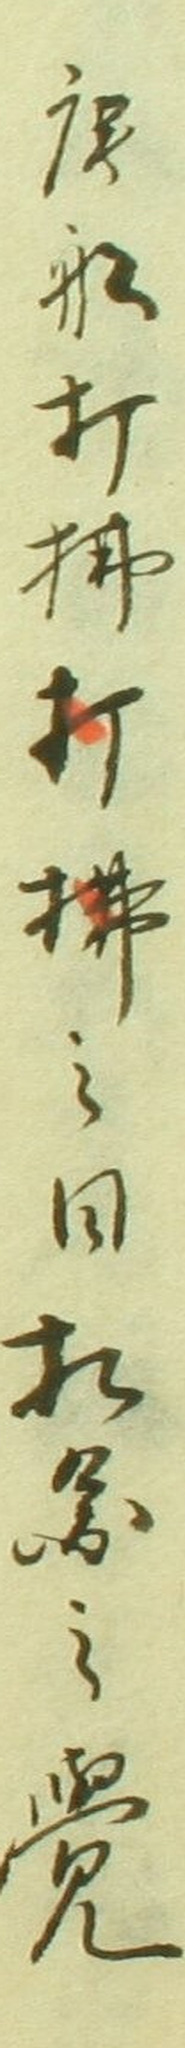唐船打払之日相図之覚
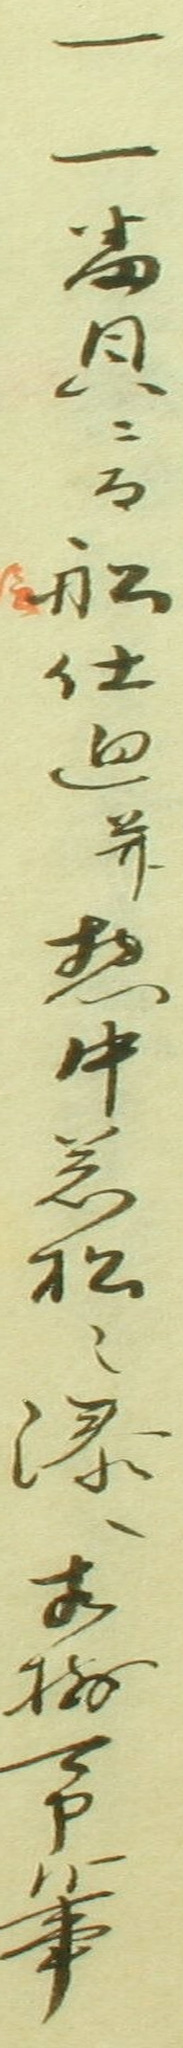一一番貝ニ而船仕廻并惣中若松之湊へ相揃可申候事
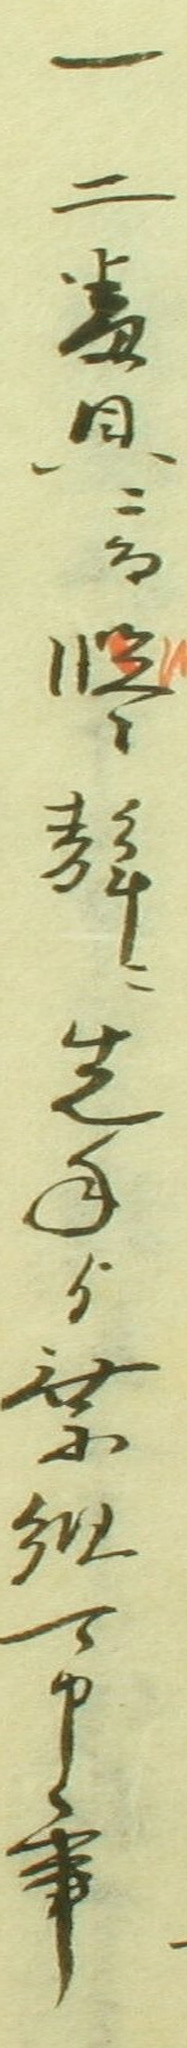一二番貝ニ而段々静に先手ゟ乗組可申候事
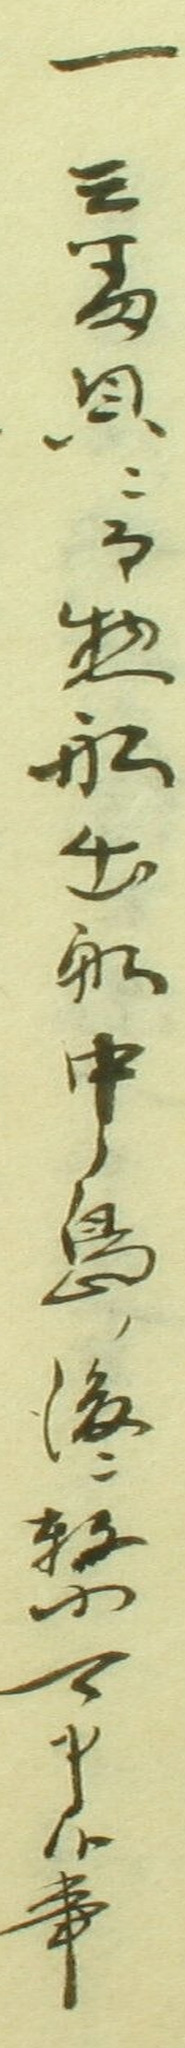一三番貝ニ而惣船出船中ノ島ノ後ニ繋可申候事
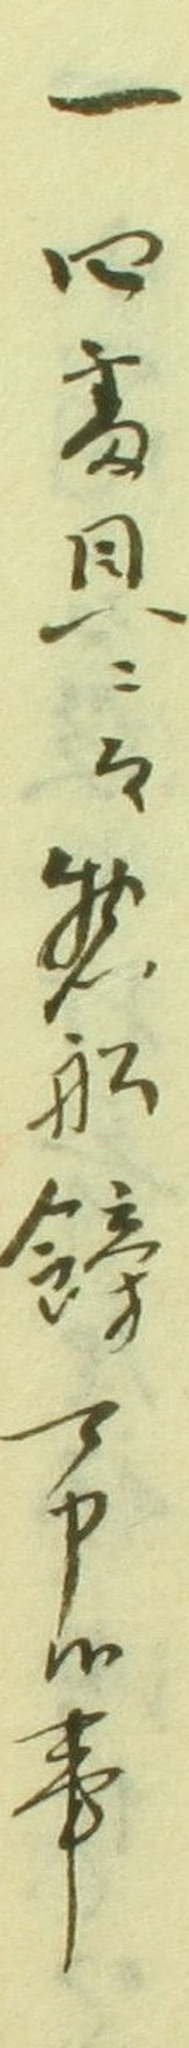一四番貝ニ而惣船飾可申候事
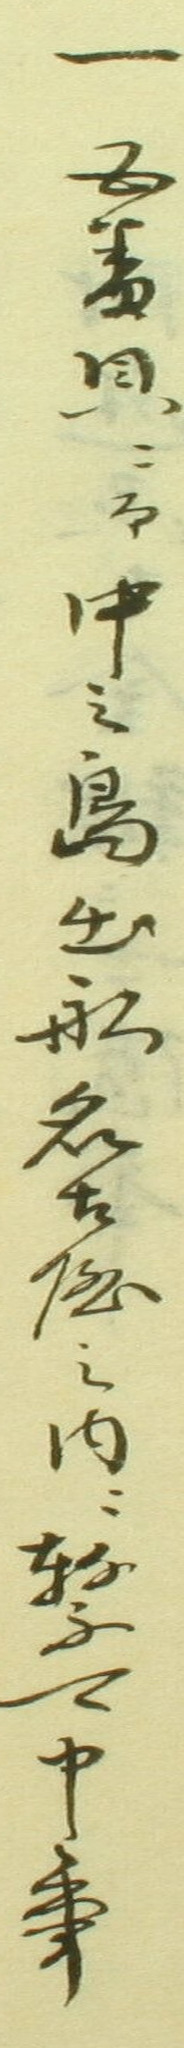一五番貝ニ而中之島出船名古屋之内ニ繋可申候事
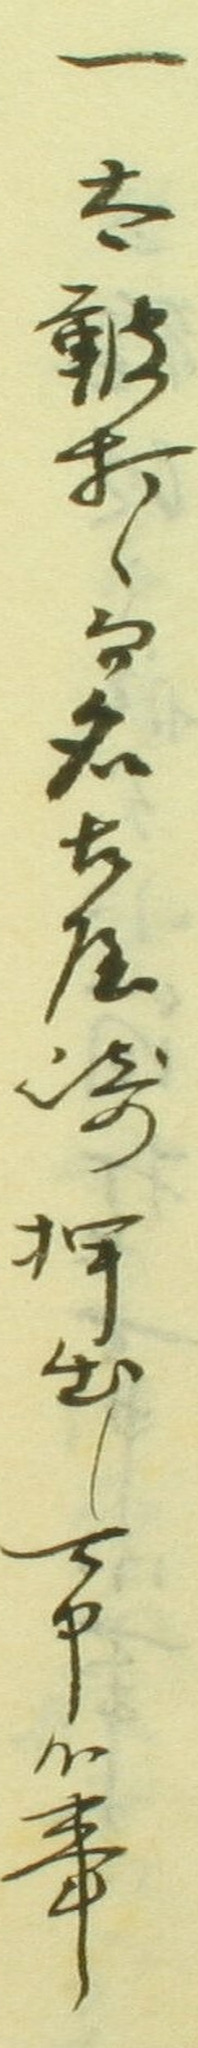一太鼓打候而名古屋崎押出し可申候事
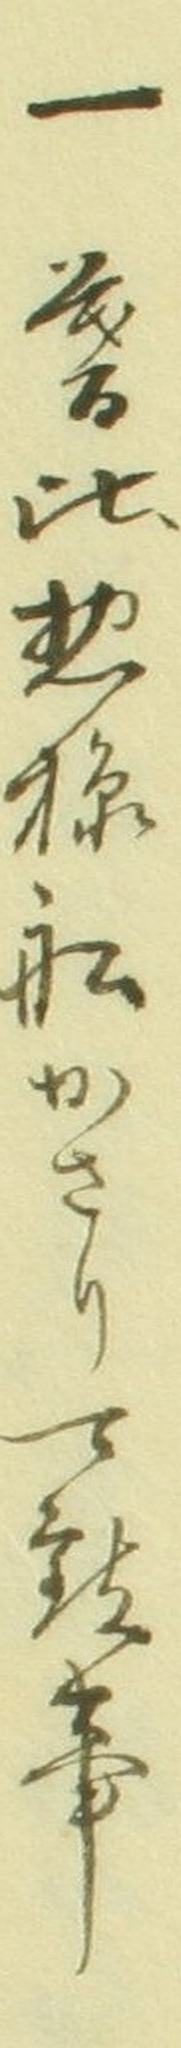一暮此惣様船かさり可致事
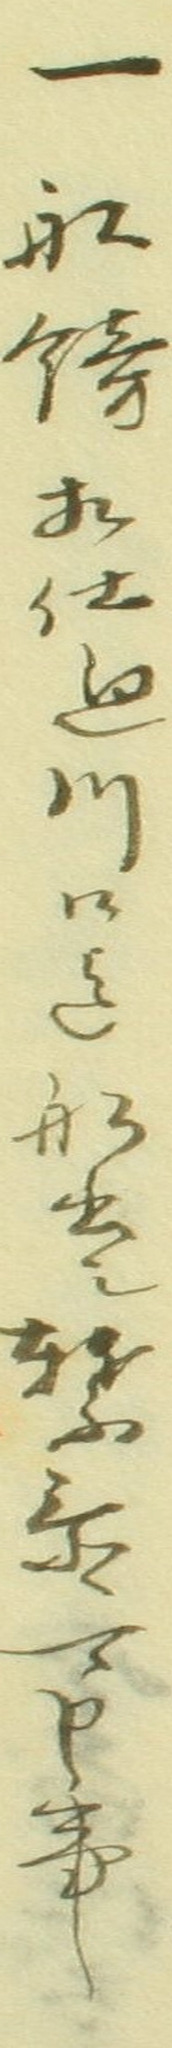一船飾相仕廻川口迄船出し繋置可申事
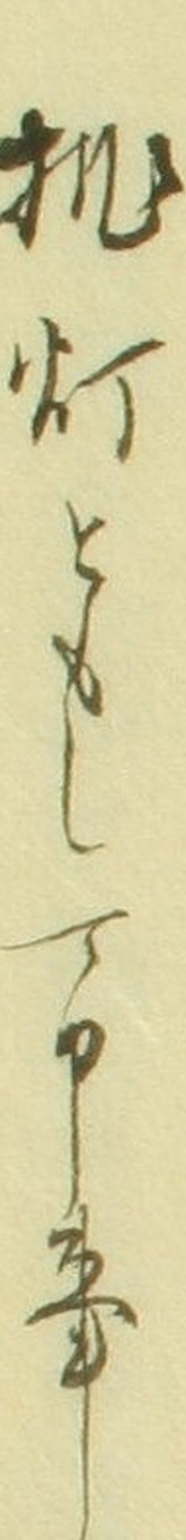挑灯ともし可申事
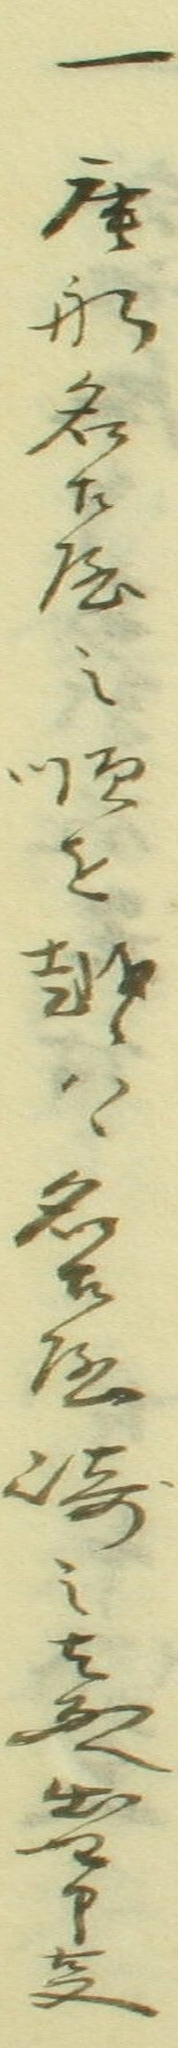一唐船名古屋之順を越候はゝ名古屋崎之はなへ出可申叓

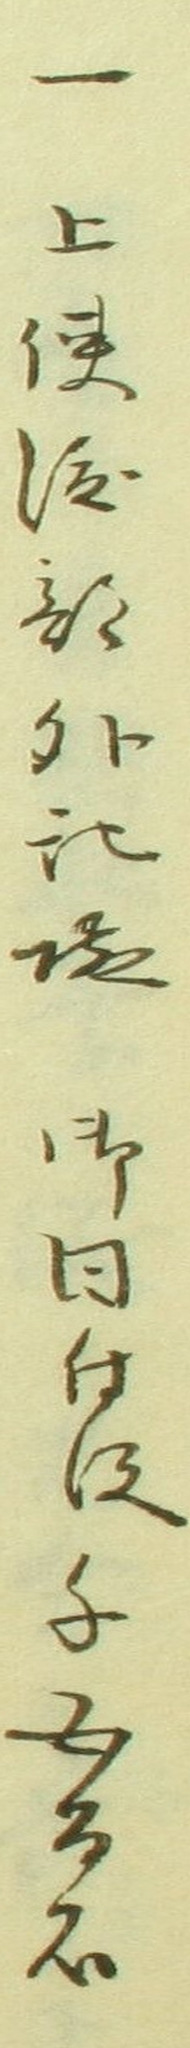一上使渡部外記様御目付役千五百石
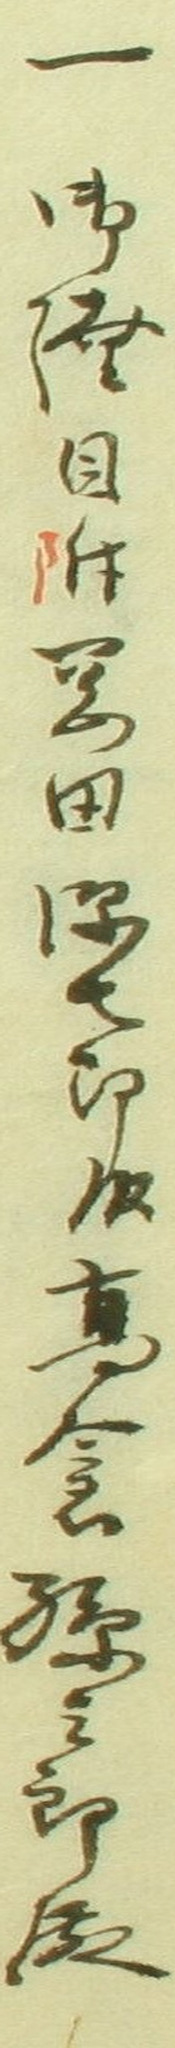一御陸目附岡田源七郎殿高倉孫三郎殿
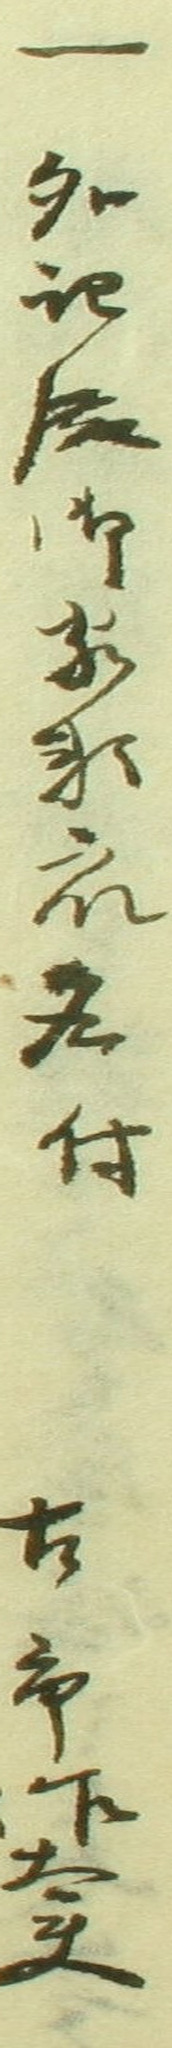一外記殿御家頼衆名付古市作太夫
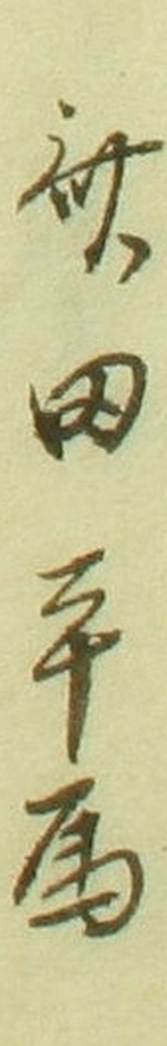斉田平馬
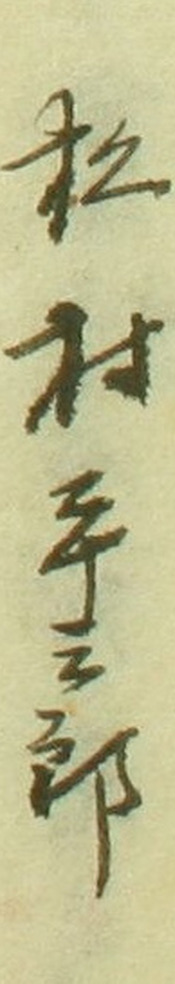杉村平三郎
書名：唐船漂流記 二
